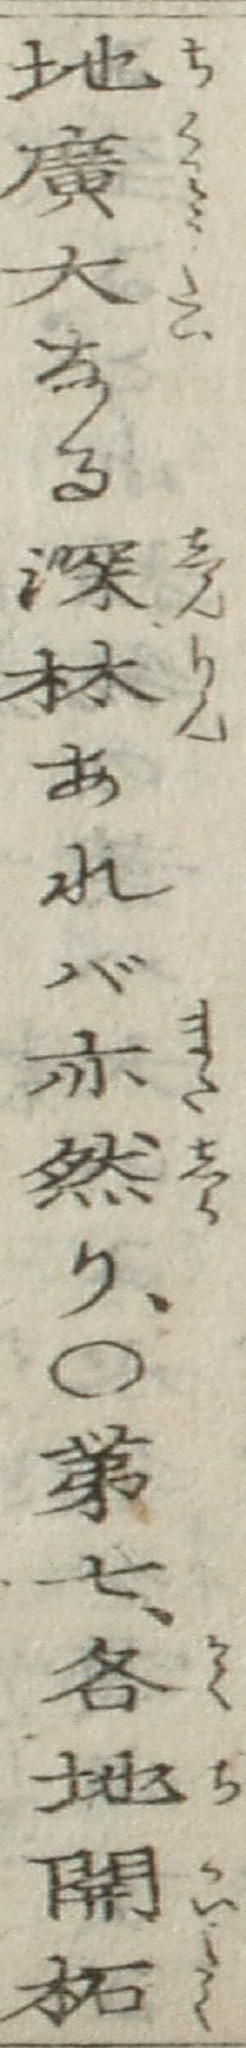地広大なる深林あれば亦然り、○第七、各地開拓
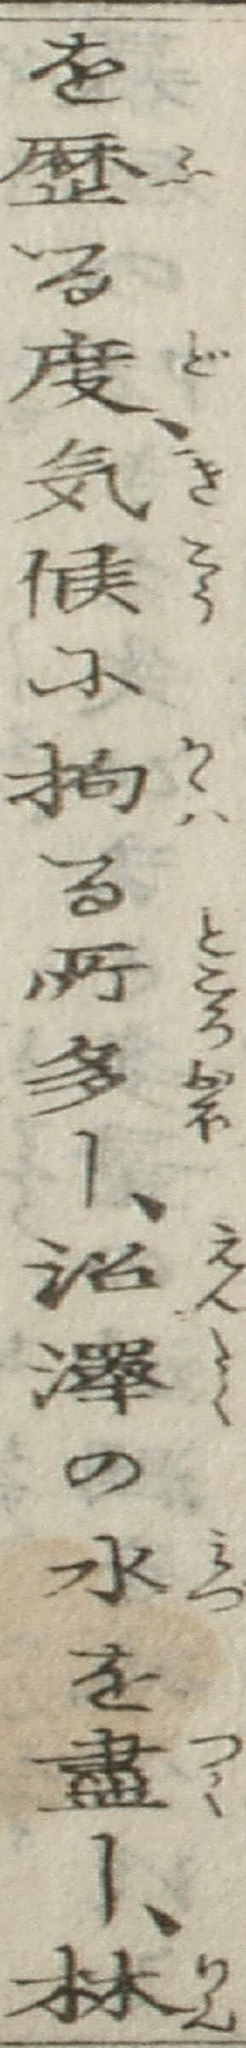を歴る度、気候に拘る所多し、沿沢の水を尽し、林
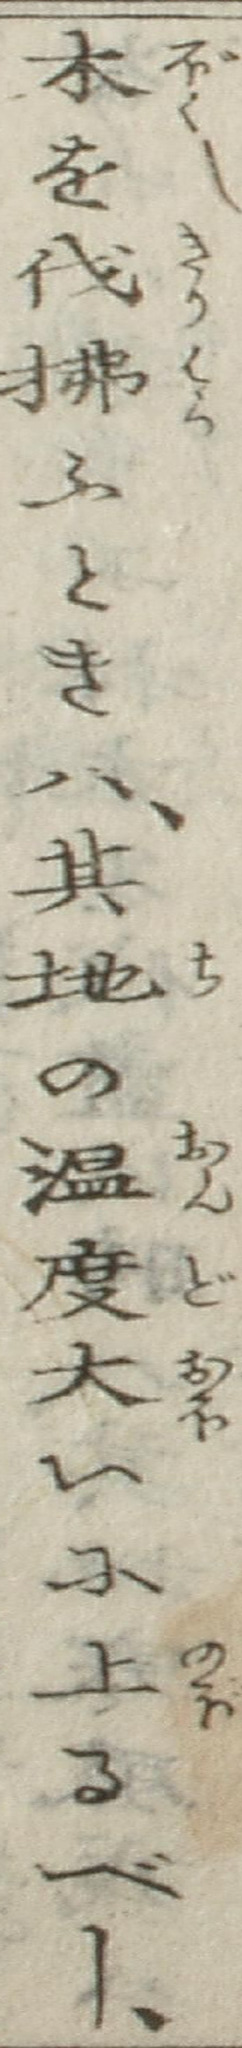木を伐払ふときは、其地の温度大いに上るべし、
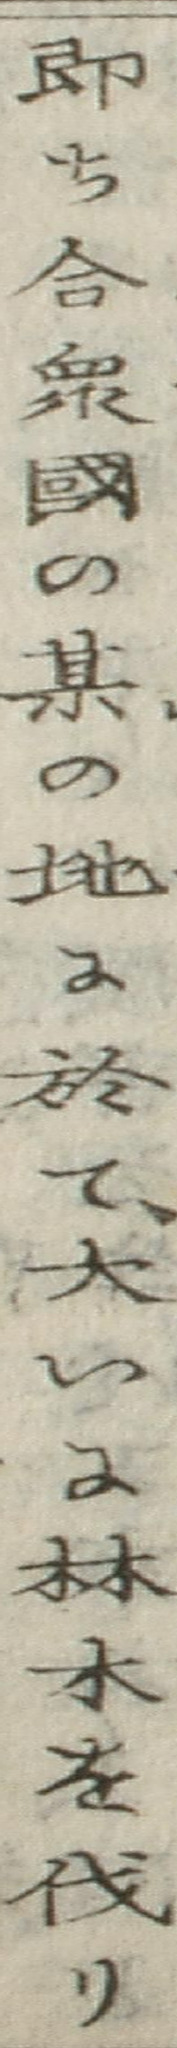即ち合衆国の其の地に於て、大いに林木を伐り
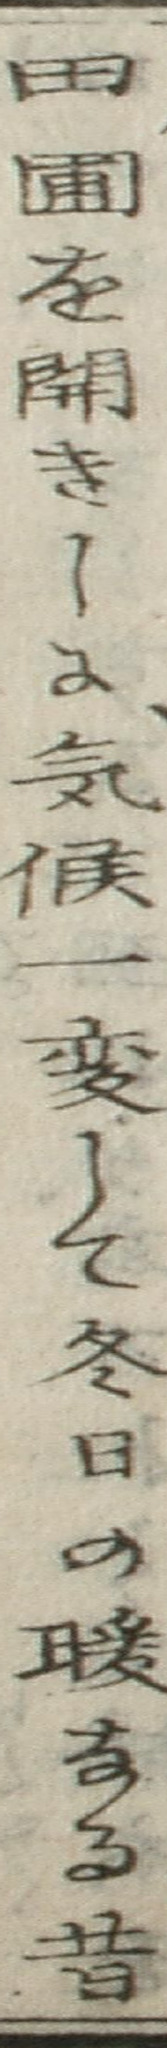田圃の開きしに、気候一変して冬日の暖なる、昔

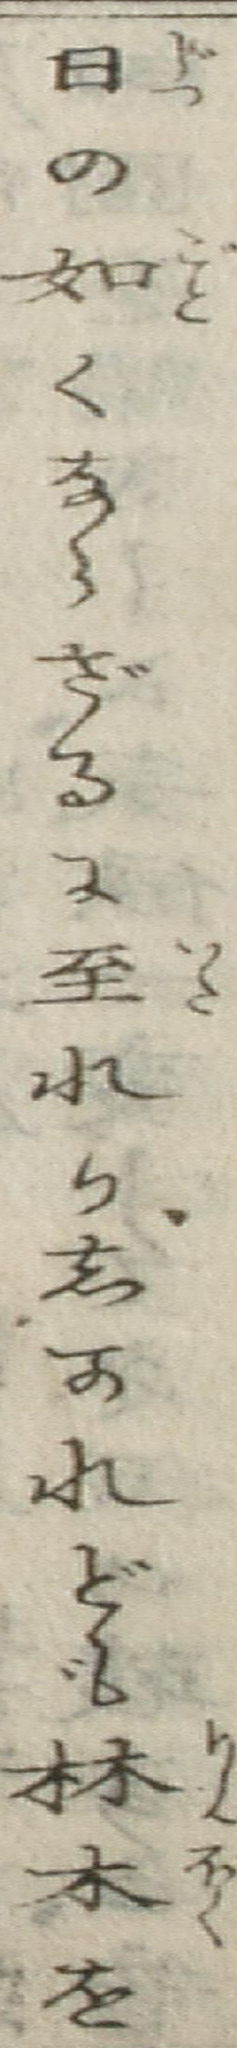日の如くならざるに至れり、しかれども林木を
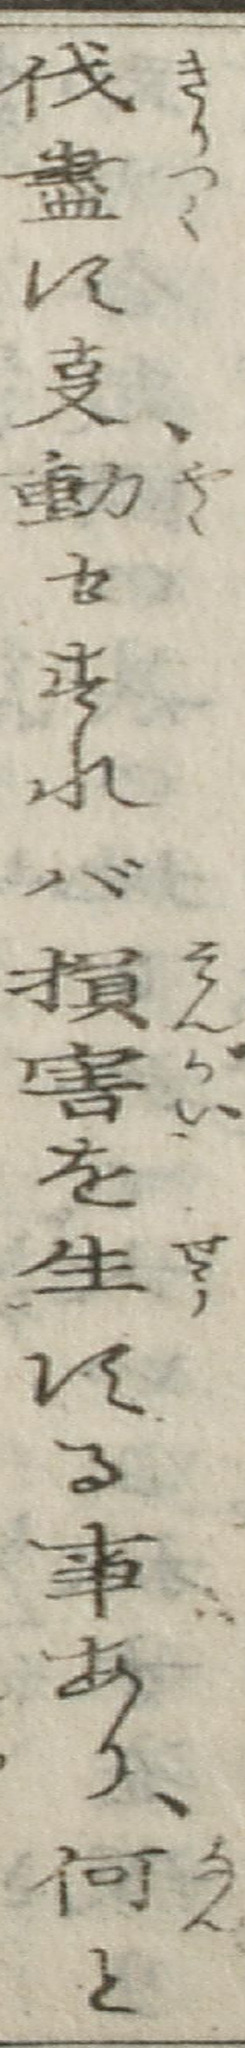伐尽す事、動もすれば損害を生する事あり、何と
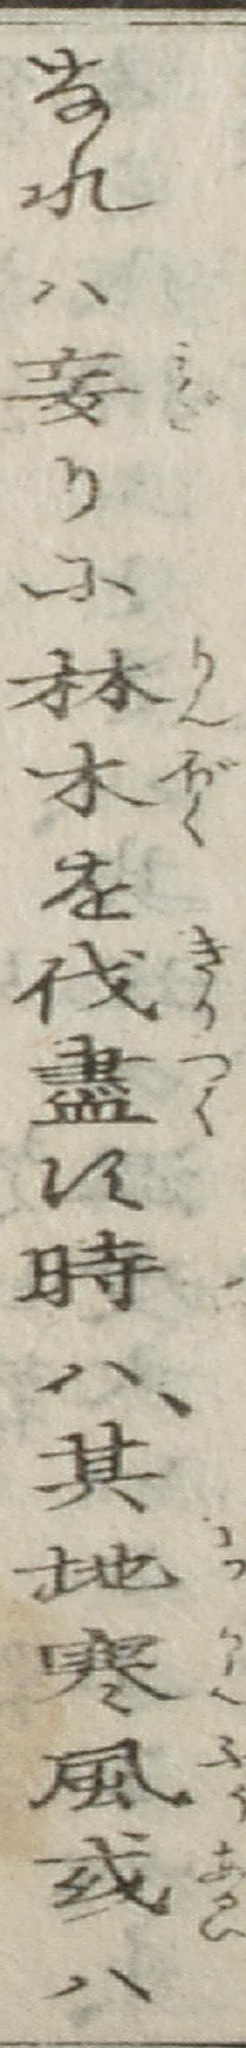なれは妄りに林木を伐尽す時は、其地寒風或は
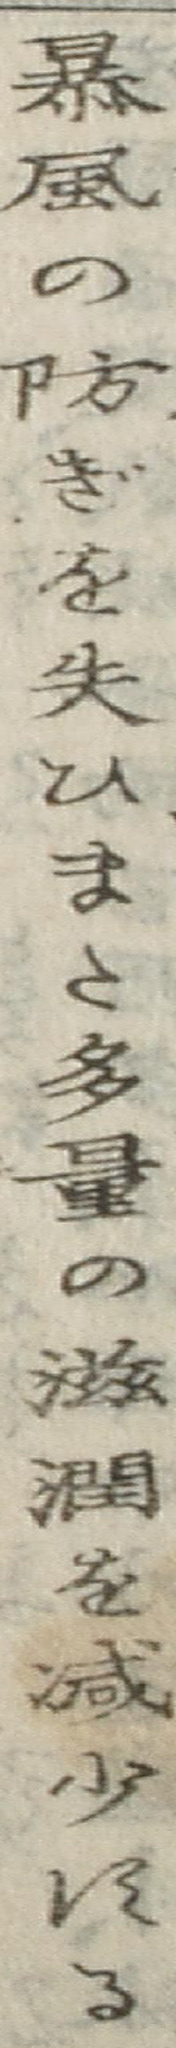暴風の防ぎを失ひ、また多量の滋潤を減少する
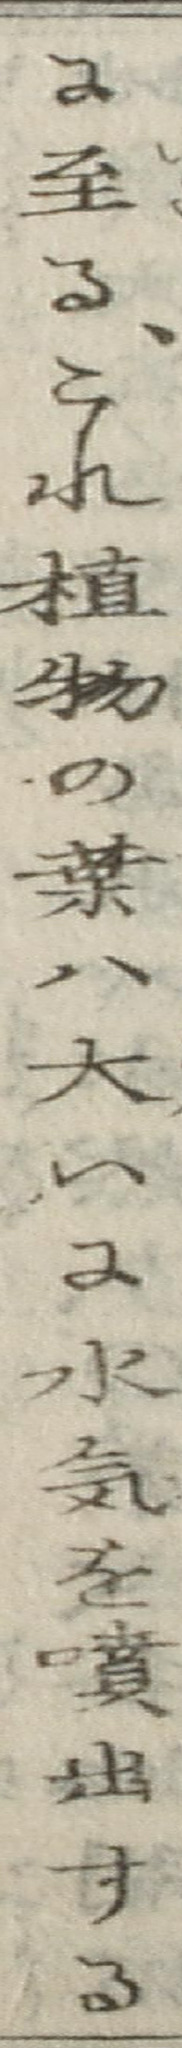に至る、これ植物の葉は大いに水気を噴出する
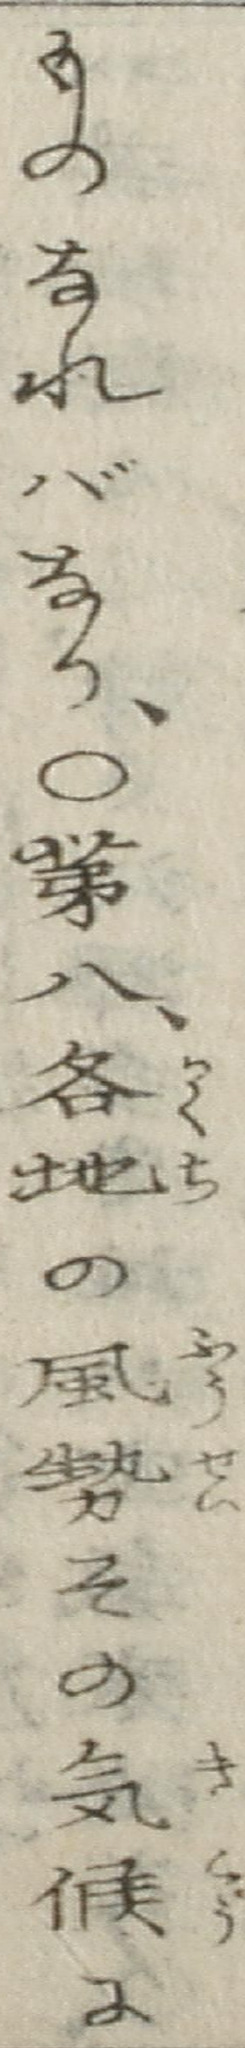ものなればなり、〇第八、各地の風勢その気候に
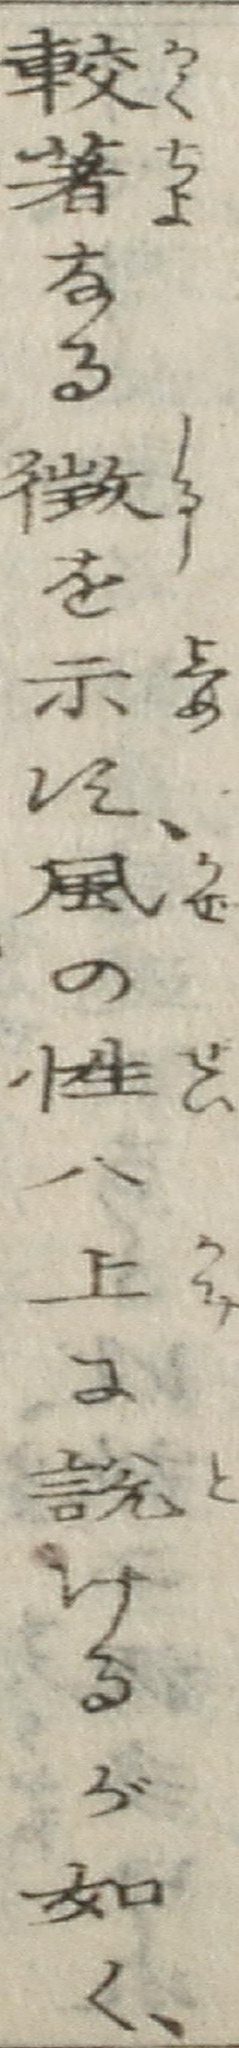較著なる徴を示す、風の性は上に説けるが如く、
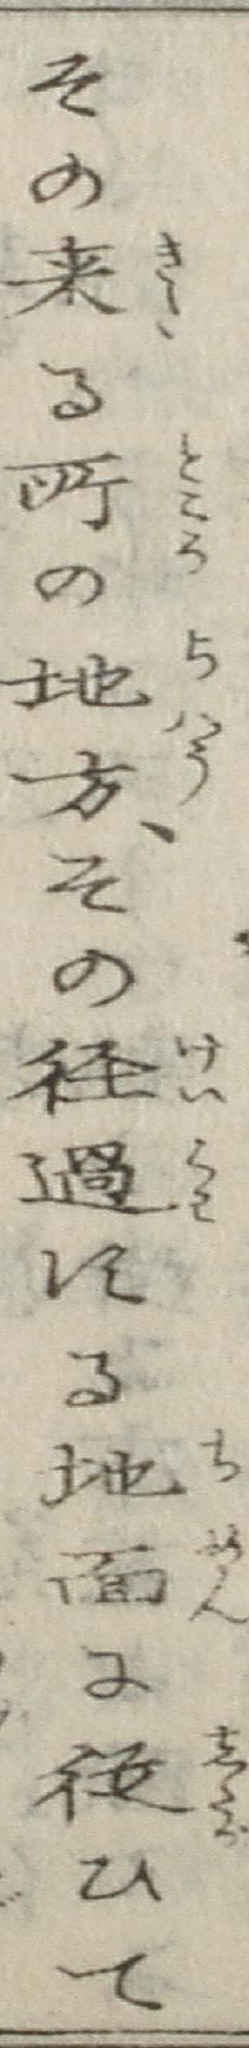その来る所の地方、その径過する地面に従ひて
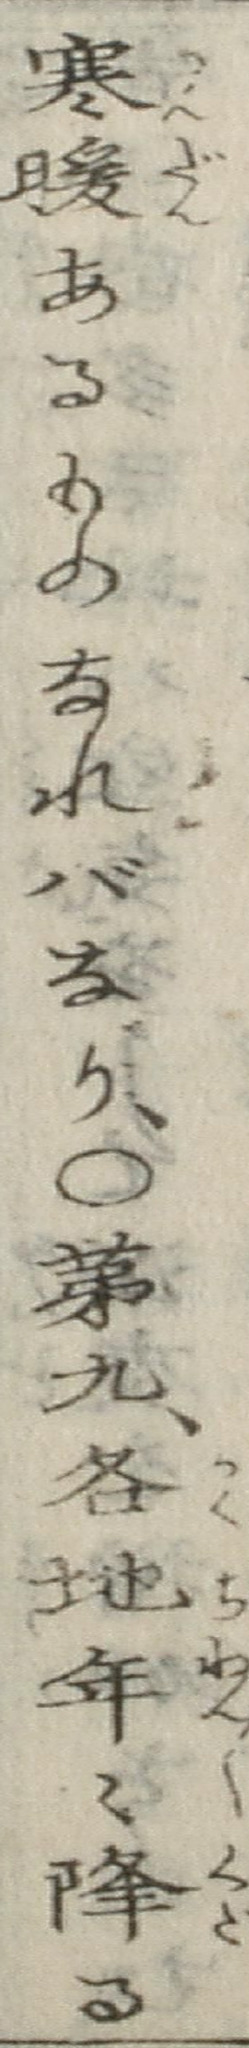寒暖あるものなればなり、〇第九、各地年々降る
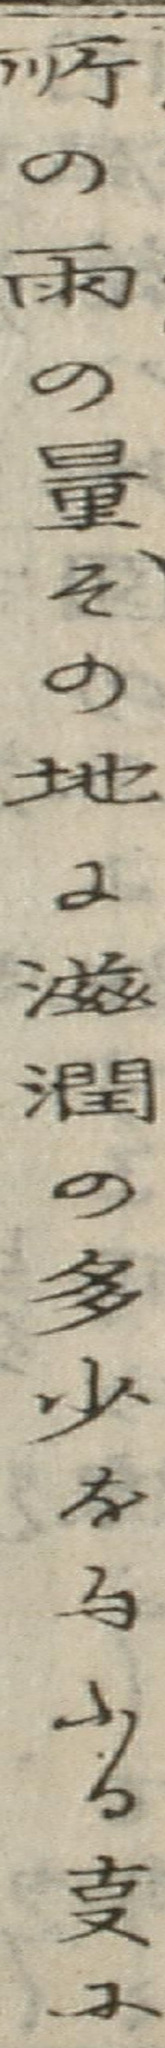所の雨の量、その地に滋潤の多少を与ふる事に
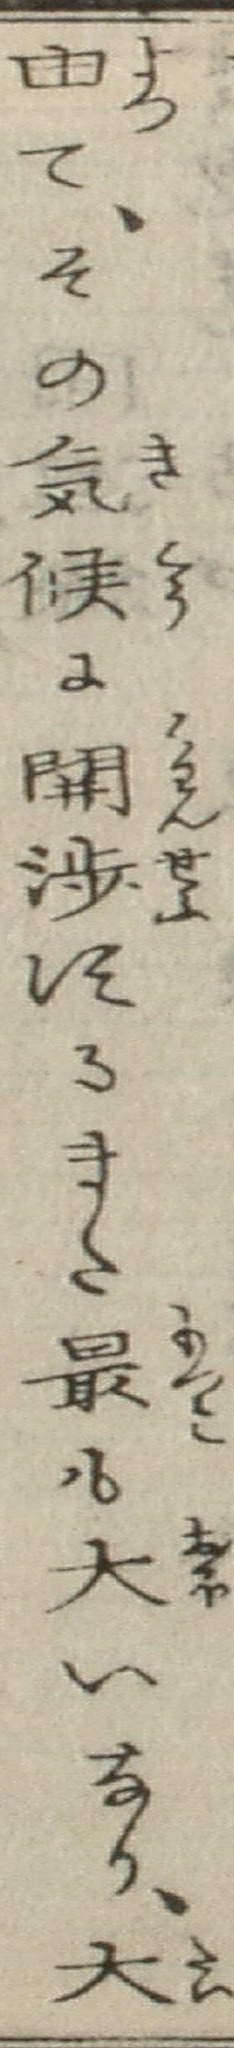由て、その気候に関渉するまた最も大いなり、大
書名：訓蒙　天然地理學　下
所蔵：東京大学地震研究所図書室 Earthquake Research Institute Library, The University of Tokyo, JAPAN
